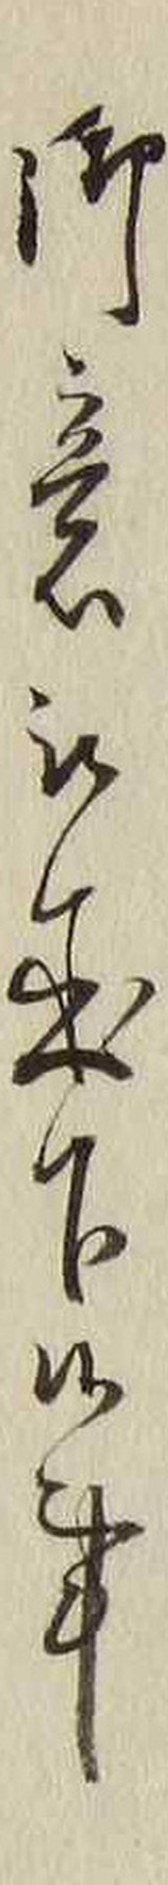御意被成下侯事

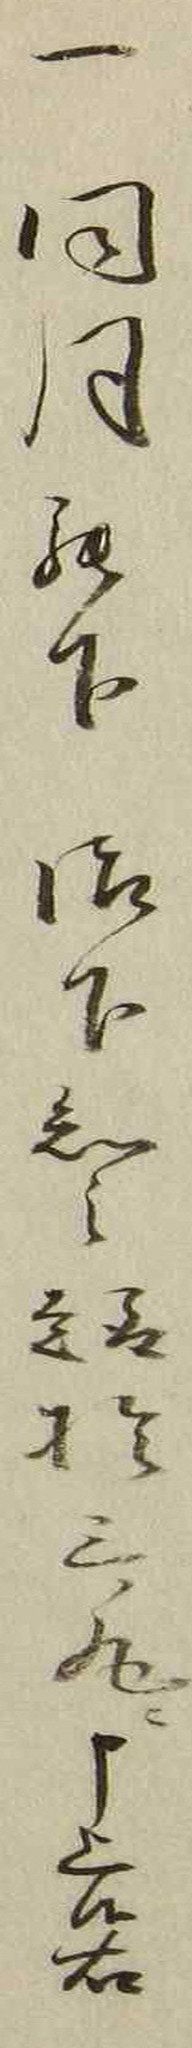一同月罷下御下知之趣於三ノ丸ニ申上候右
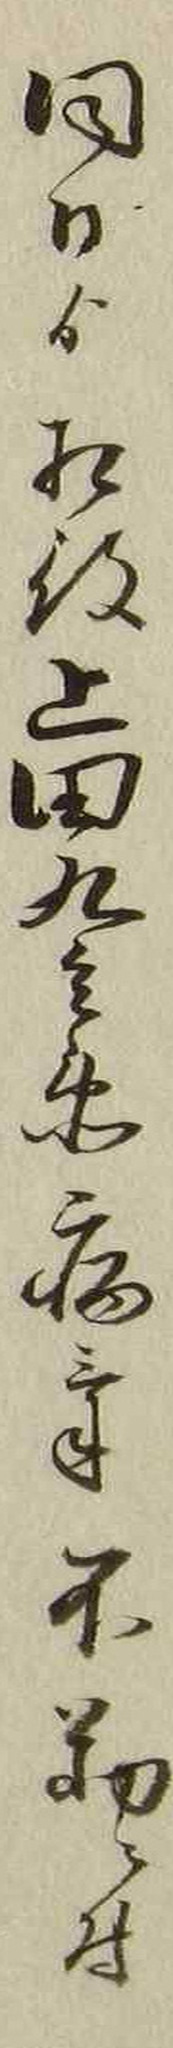同日ゟ相役上田九兵衛病気不勤ニ付
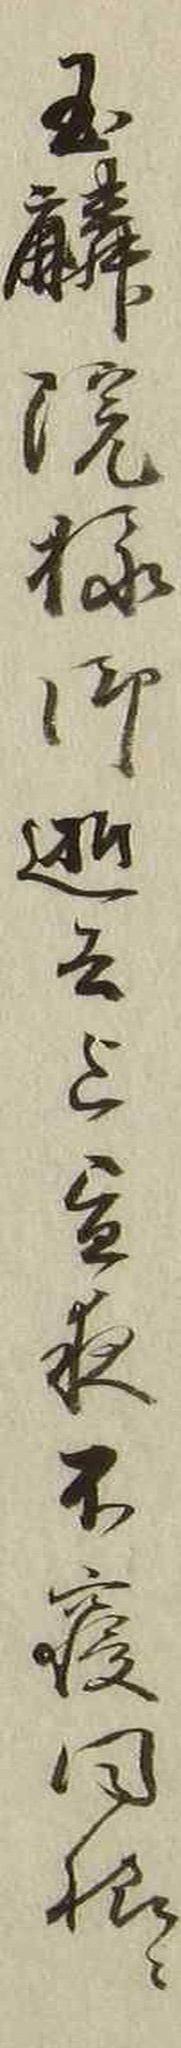玉麟院様御逝去迄昼夜不寝同様ニ
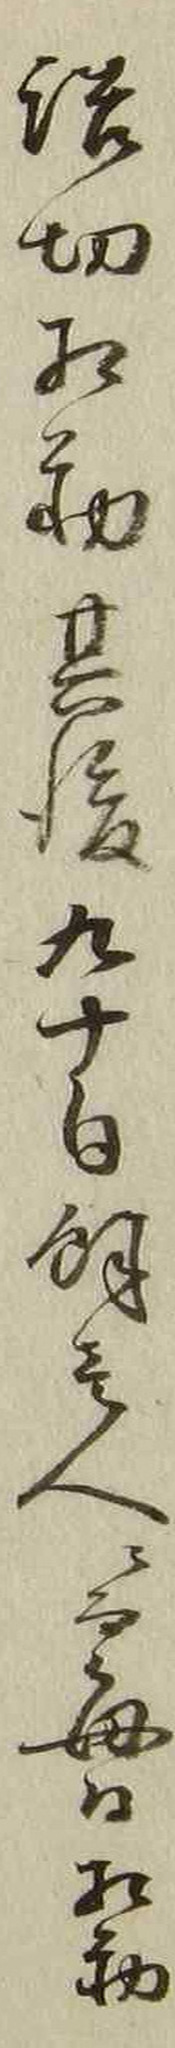詰切相勤其後九十日余壱人ニ而毎日相勤
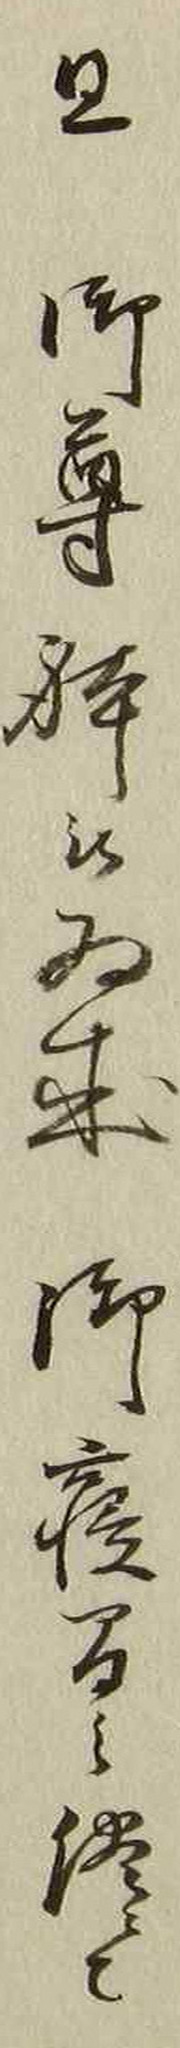且御尊体被為成御寝間之儘ニて
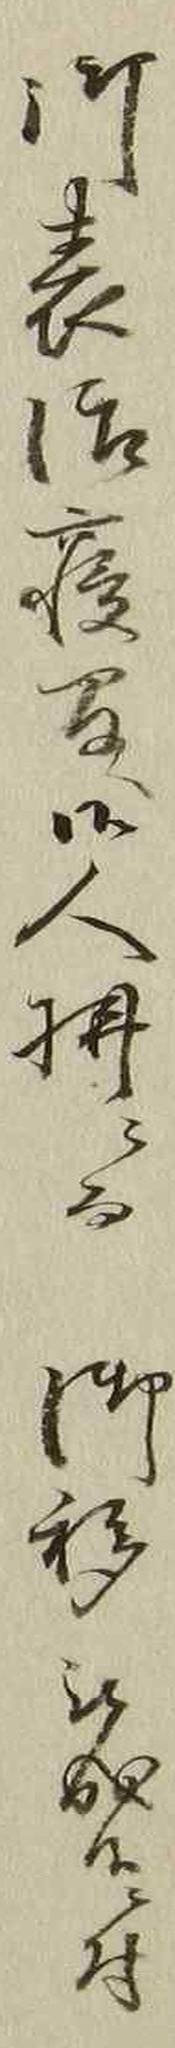御表御寝間へ御人払ニ而御移被成候ニ付
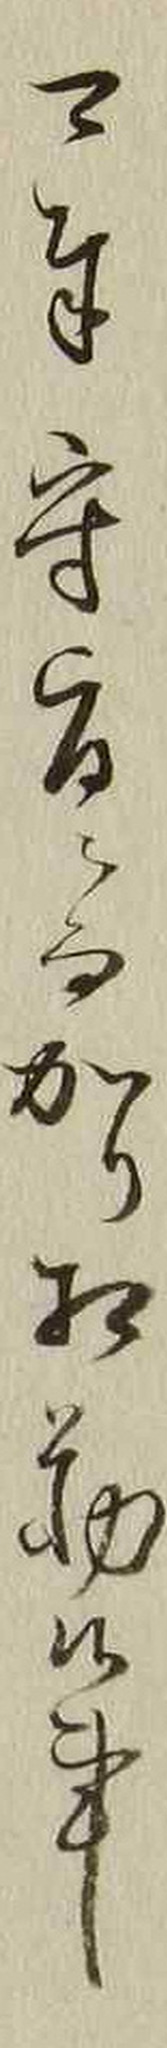可奉守旨ニ而加り相勤候事
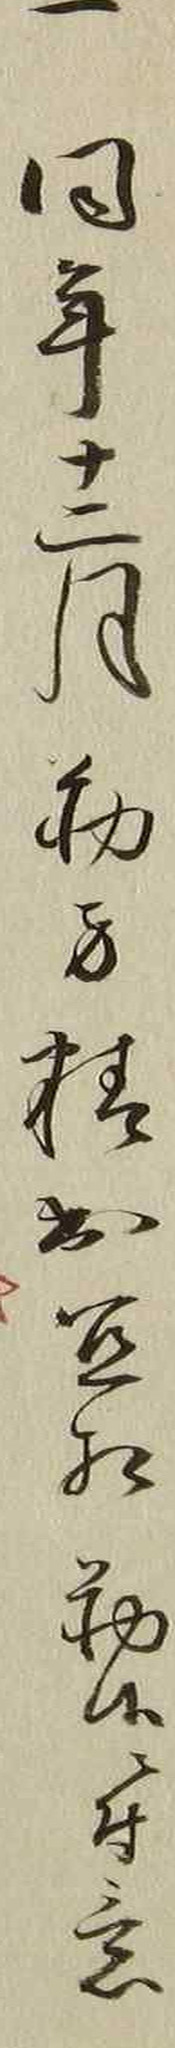一同年十二月勤方精出宜相勤候ニ付意
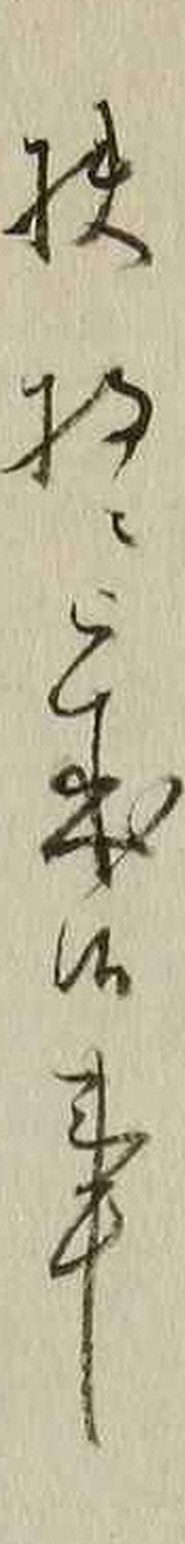扶持ニ被成候事
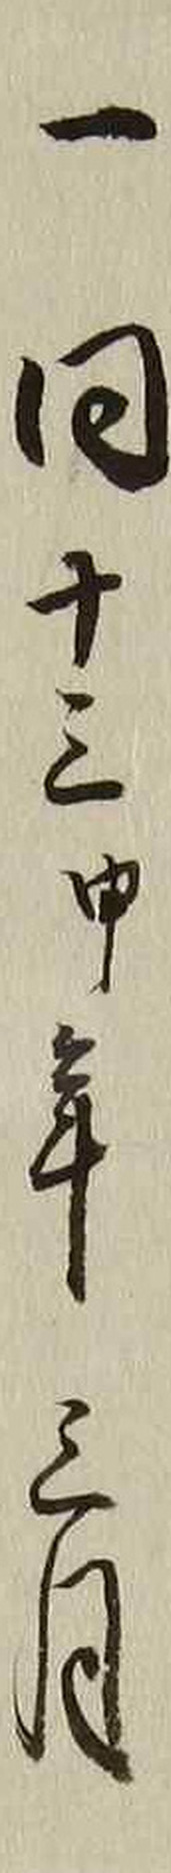一同十三申年三月
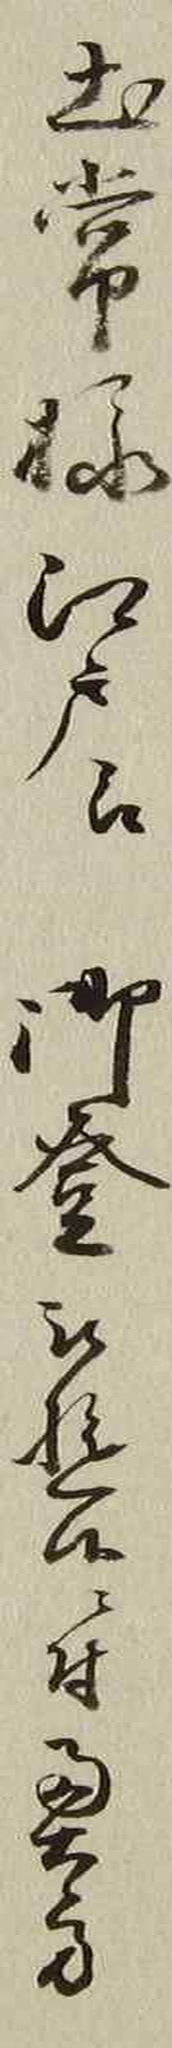土常様江戸江御登被遊候ニ付奥方
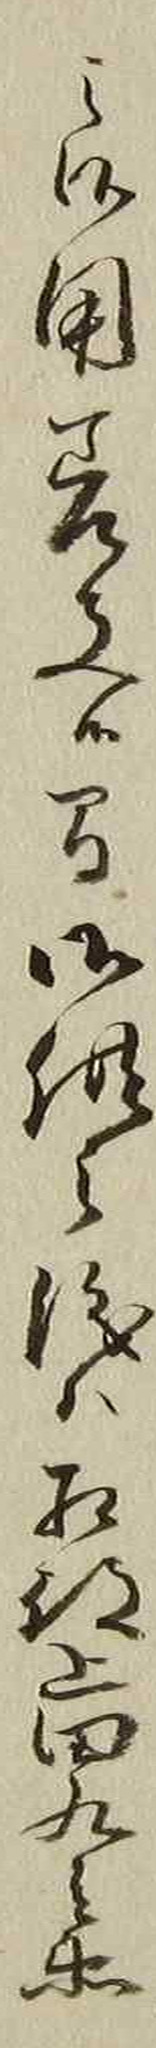之御用差支候間御供之儀ハ相役上田九兵衛ニ
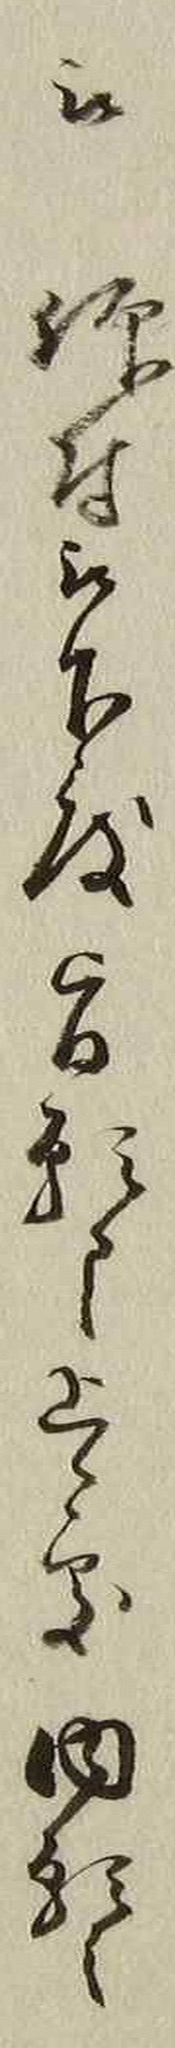被仰付被下度旨願申上候処内願之
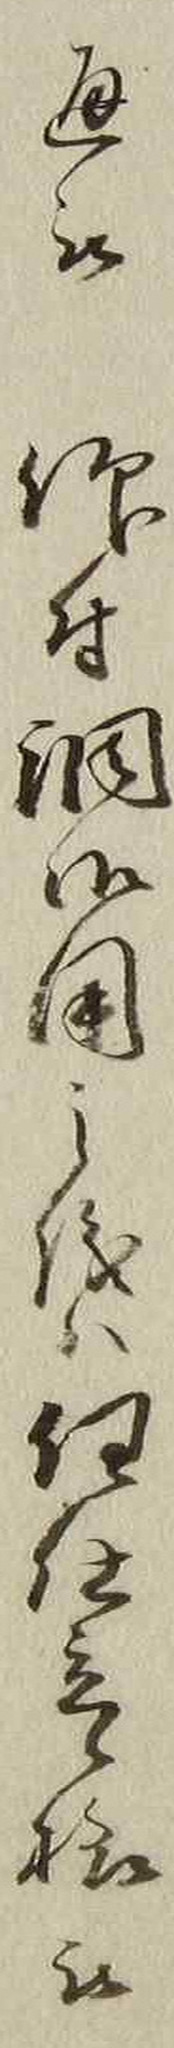通被仰付調御用之儀ハ任仕立候様被
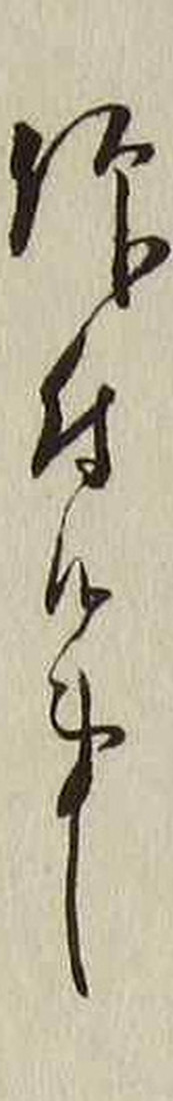仰付候事
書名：諸士系譜　巻之28　い之部28
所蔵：会津若松市立会津図書館
